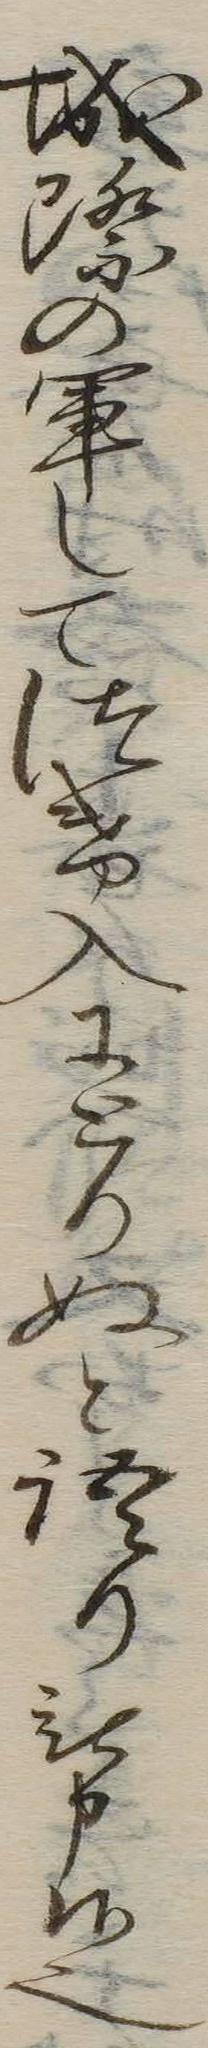城際の軍してつけ入にとりぬと語り被申候也
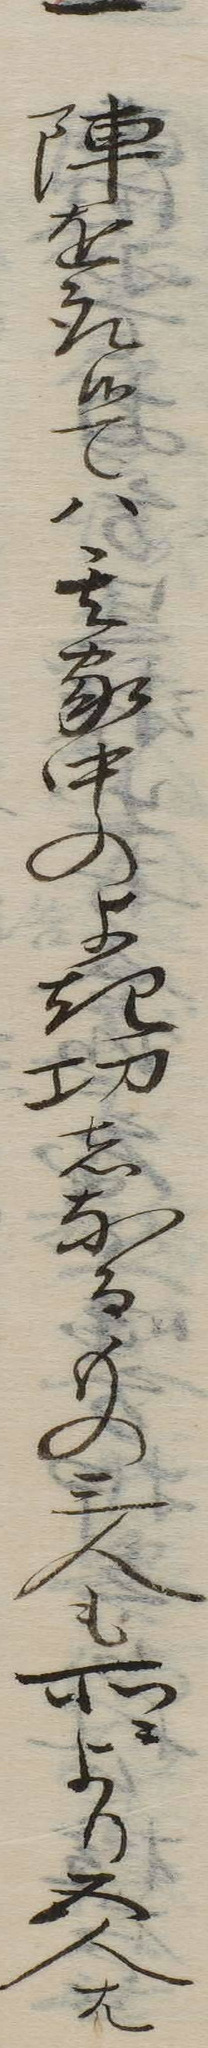一陣を取候ては其家中のよき功者なるもの三人も所ニより五人は
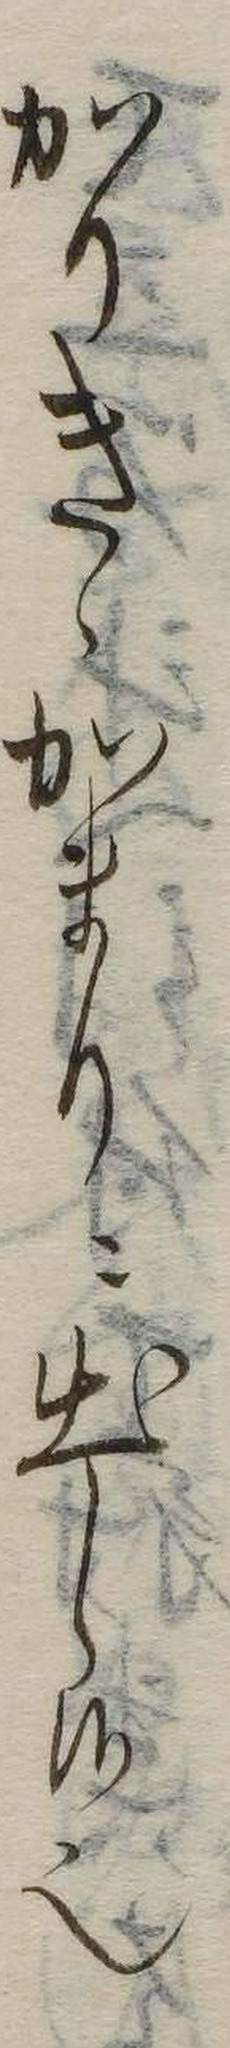かりきゝかまりニ出し候也
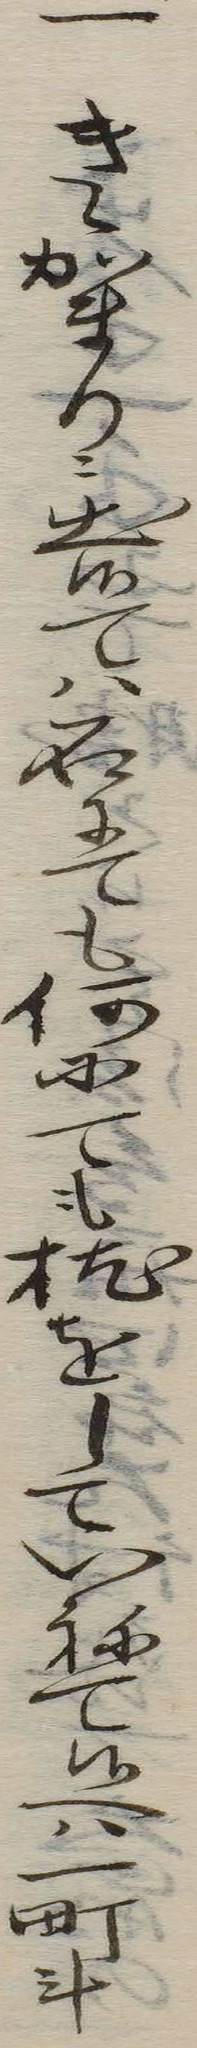一きゝかまりニ出候ては名にても何にても枕をしていねて候へは一町計
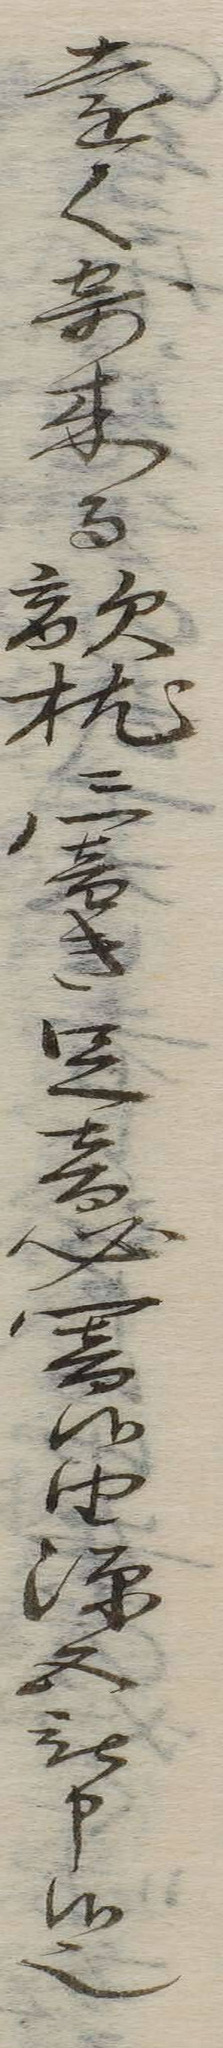遠く寄来る敵枕ニ響き足音必響候由源五被申候也
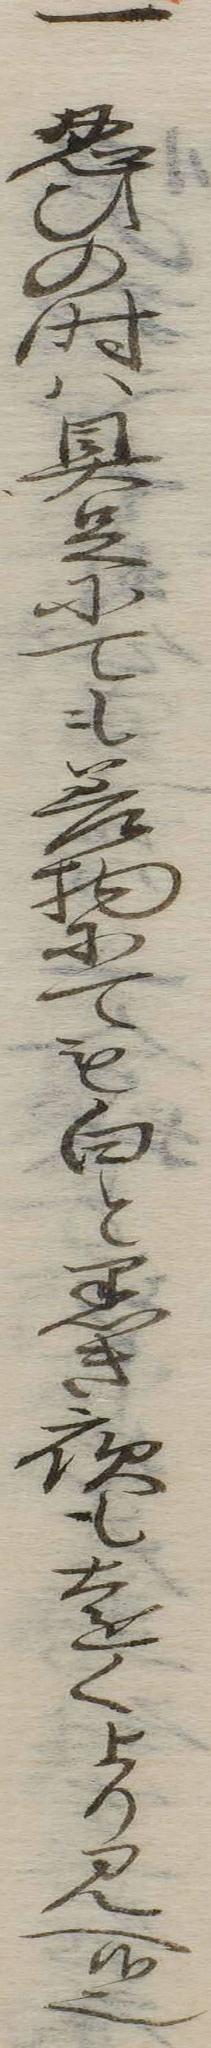一忍びの時は具足にても差物にても白と黒き夜も遠くより見へ候也
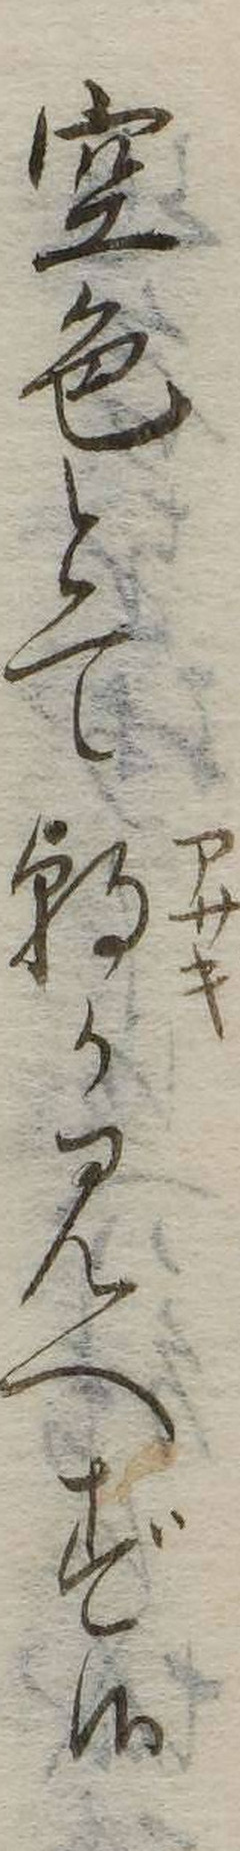空色とて朝が見へず候
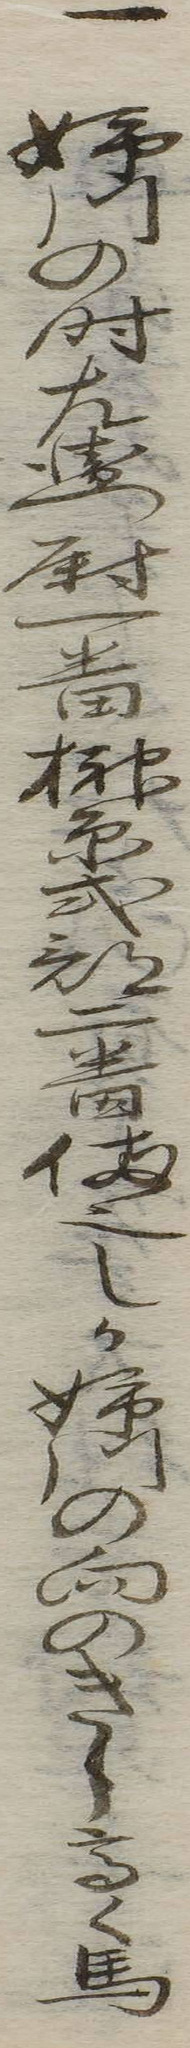一姉川の時左衛門尉一番榊原式部二番備也しか姉川の向のきし高く馬
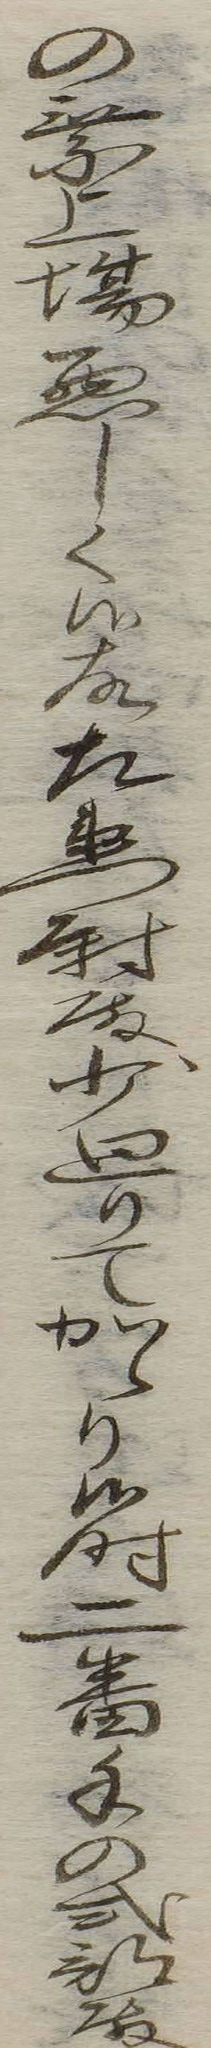の乗上場悪しく候故左衛門尉殿少廻りてかヽり候時二番手の式部殿
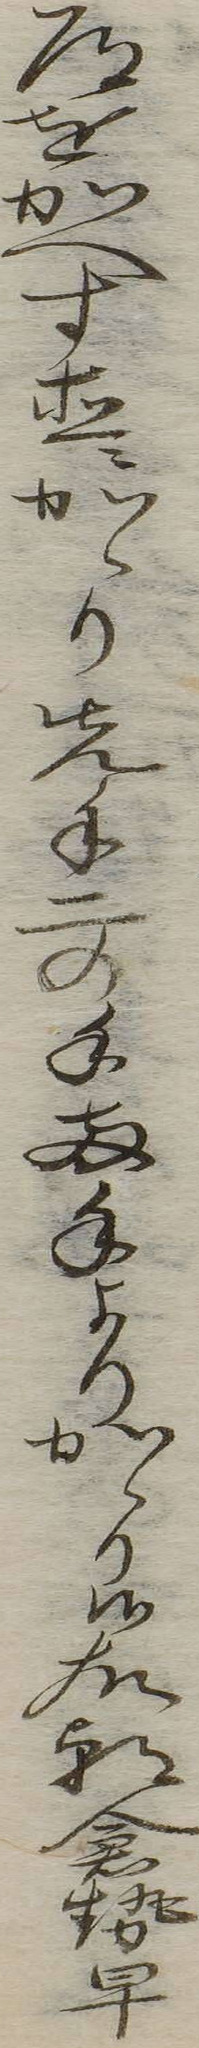道をかへす置ニかヽり先手二の手両手よりかヽり候故朝倉勢早
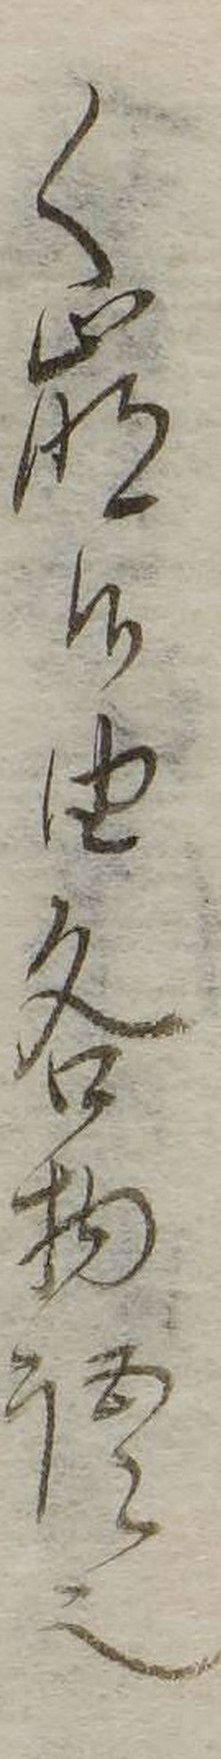く崩候由各物語也
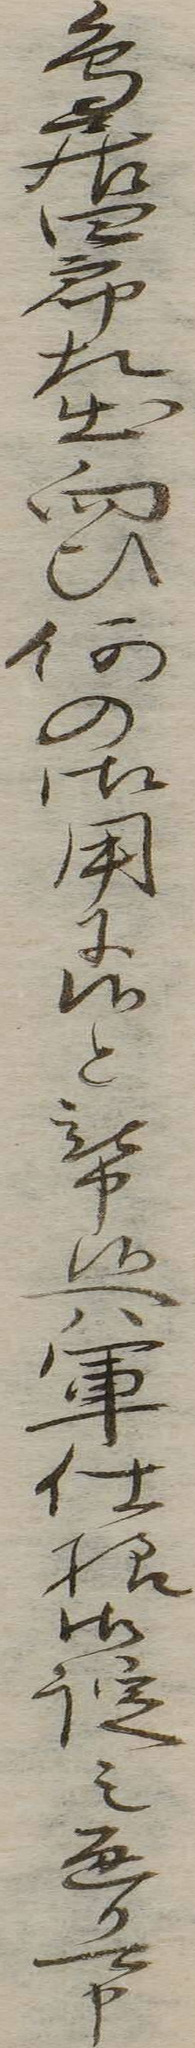鳥居四郎左出向ひ何の御用に候と被申候は軍仕様御諚之通り可申
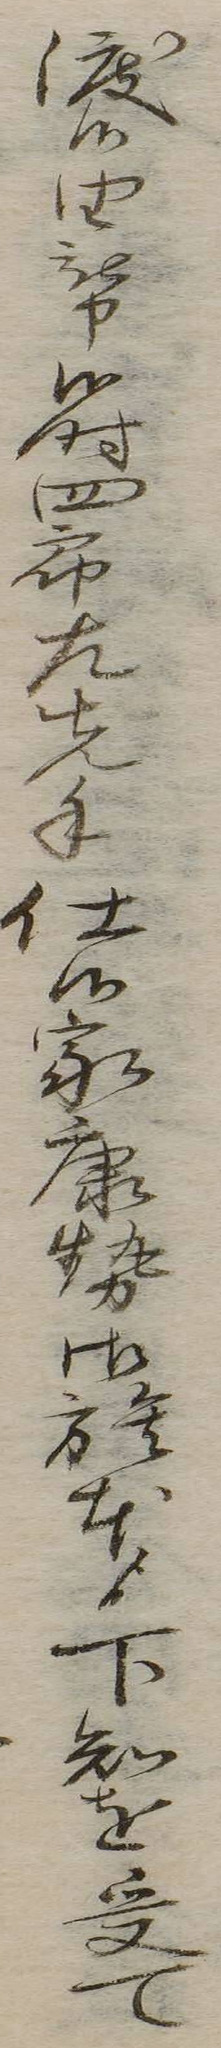渡候由被申候時四郎左先手仕候家康勢御旗本ゟ下知を受て
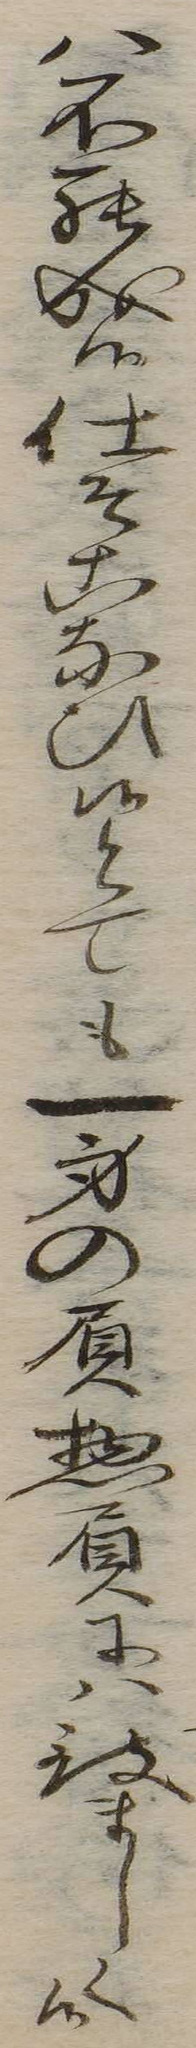は不能成候仕そこなひ候とても一身の負惣負ニは到ましく候

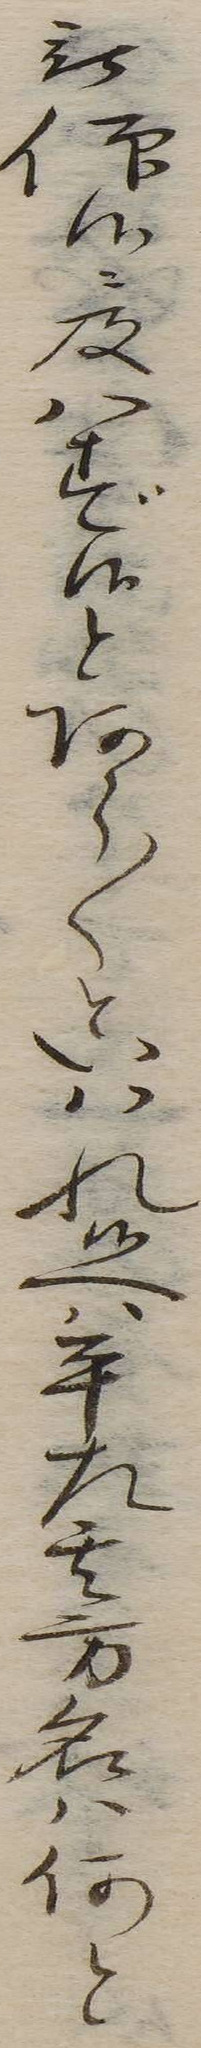被仰候ニ及はず候とあら〳〵といはれ候へは平左其方名は何と
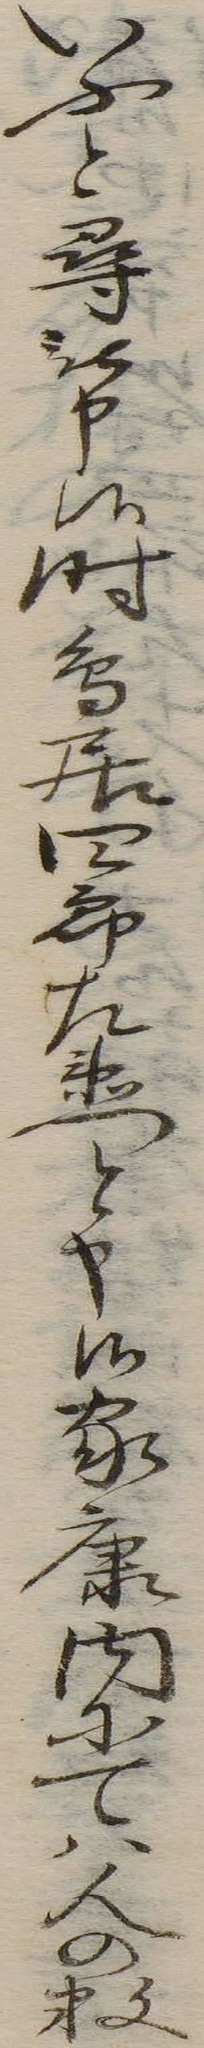いふと尋被申候時鳥居四郎左衛門と申候家康内にて八人の数
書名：三河之物語
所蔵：国文学研究資料館
